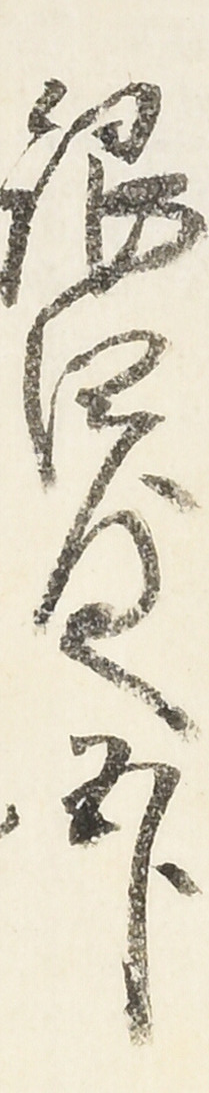銀四匁五分
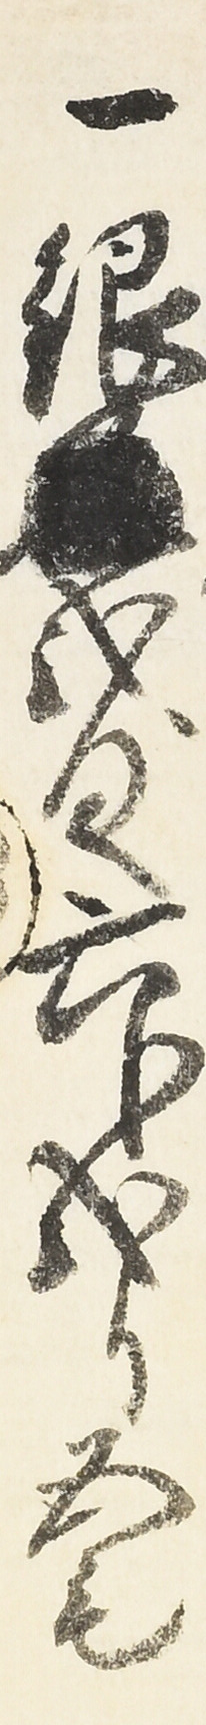一銀弐匁六分弐厘五毛
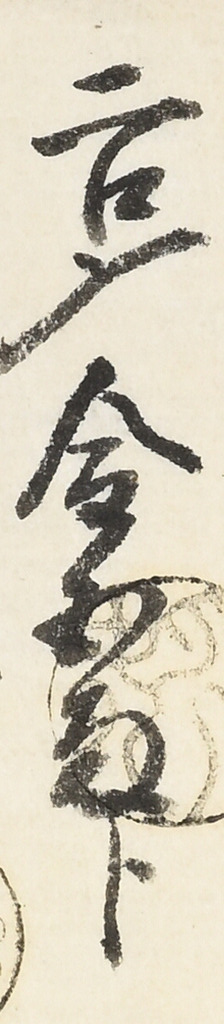二口〆金五両ト
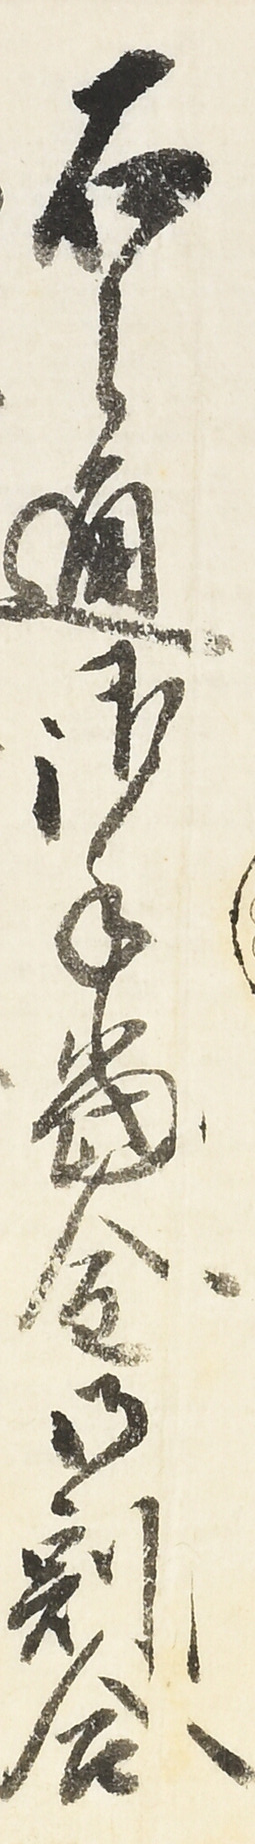右之通御手当金御割合
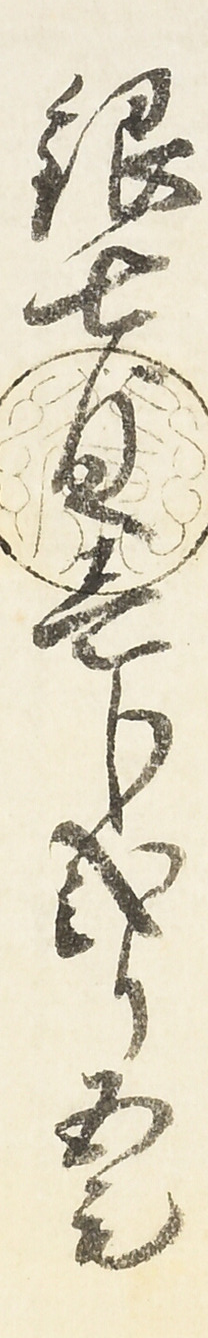銀七匁壱分弐厘五毛
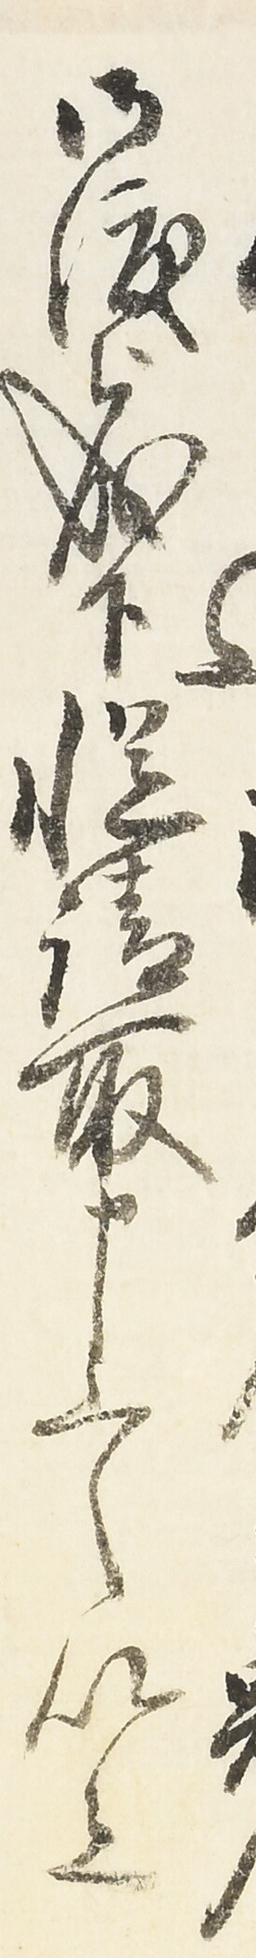御渡被成下慥請取申上候以上
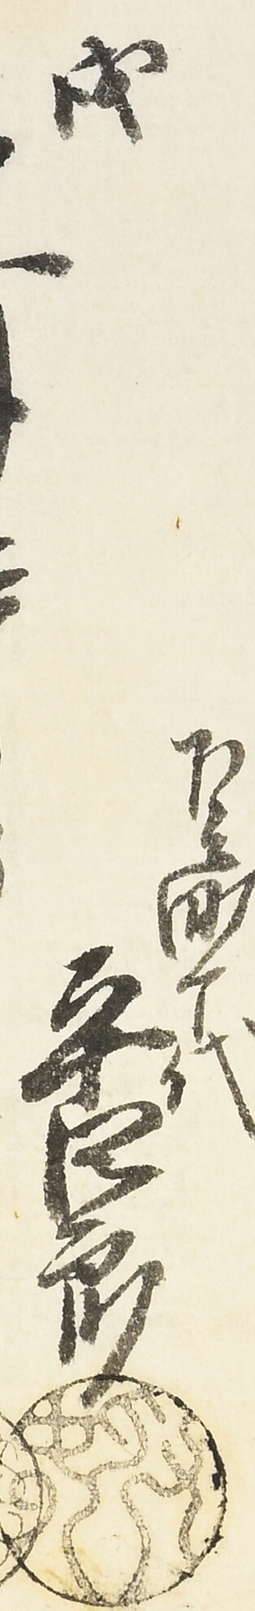戌平四郎
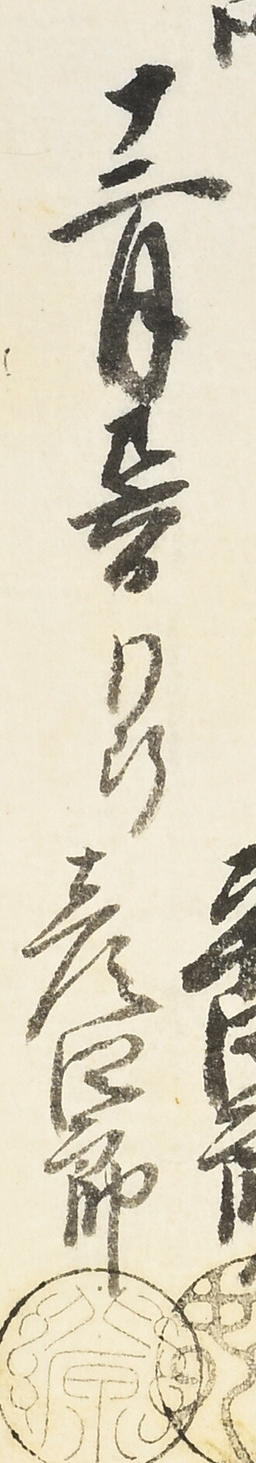十二月廿六日同断彦四郎
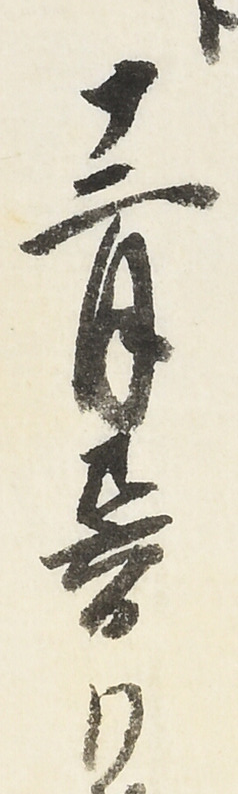十二月廿六日同断
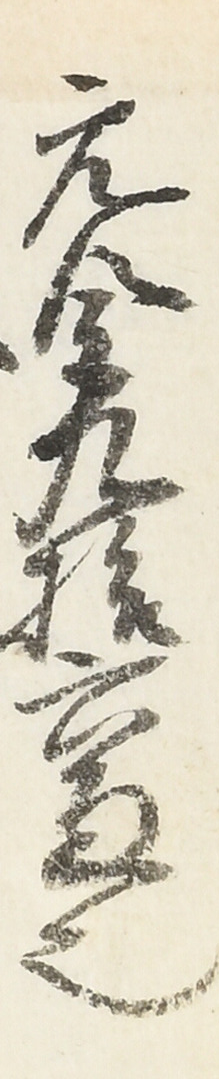元金九拾六両也
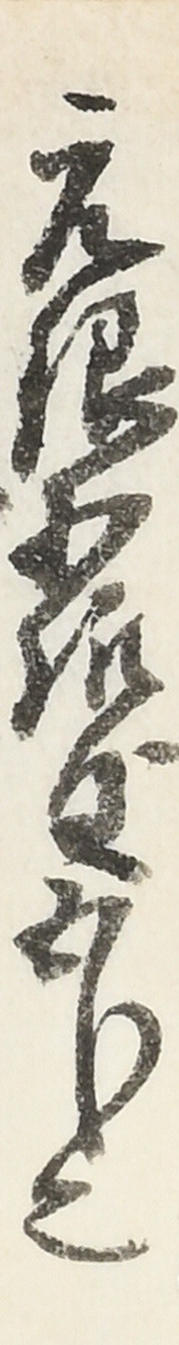元銀五拾匁五分也
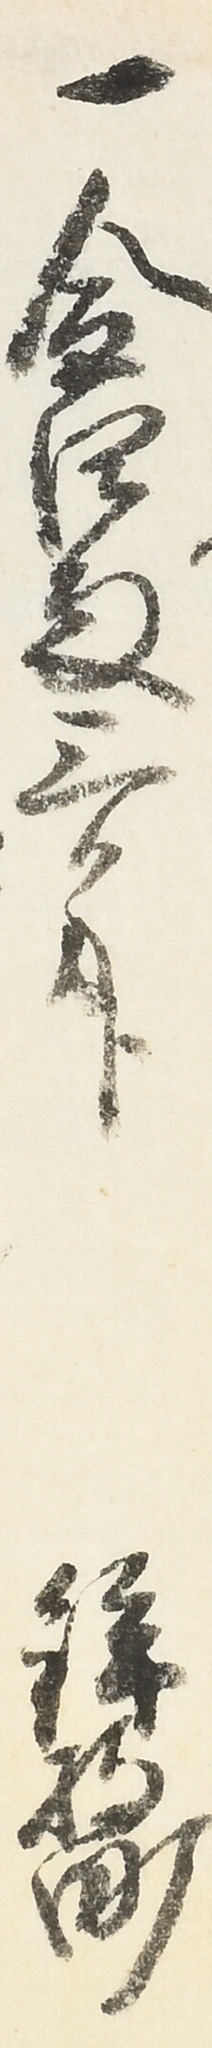一金四両三分ト鉾持町
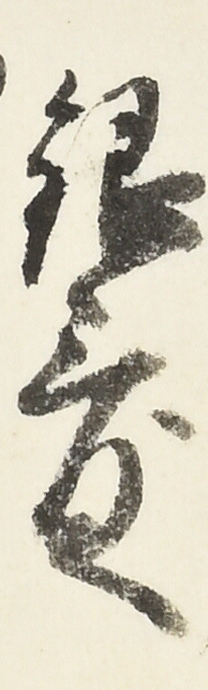銀三匁
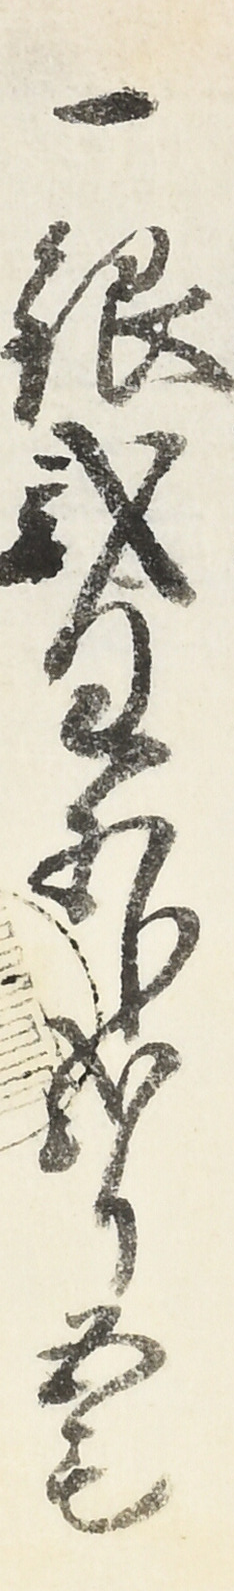一銀弐匁五分弐厘五毛
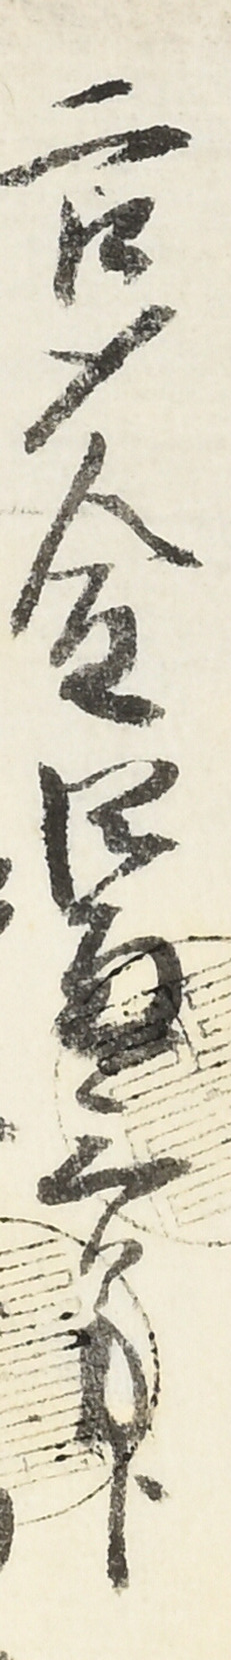二口〆金四両三分ト
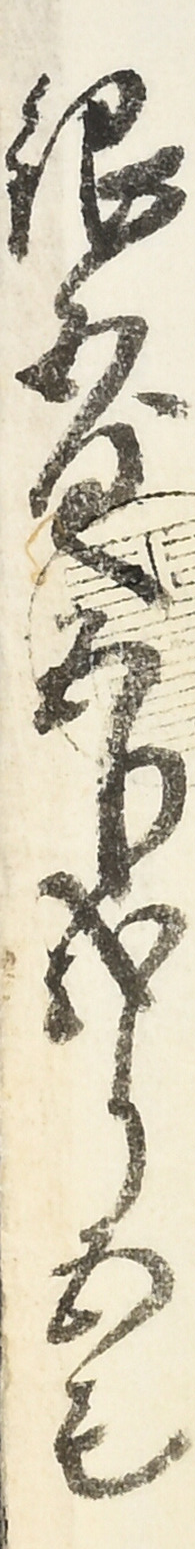銀五匁五分弐厘五毛
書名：御才覚金御利足割渡扣帳
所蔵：伊那市立高遠町図書館・合同会社AMANE
